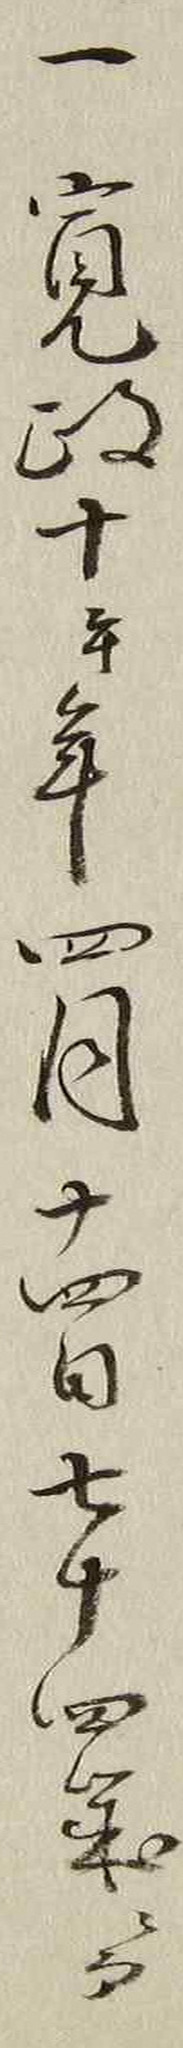一寛政十午年四月十四日七十四歳に而
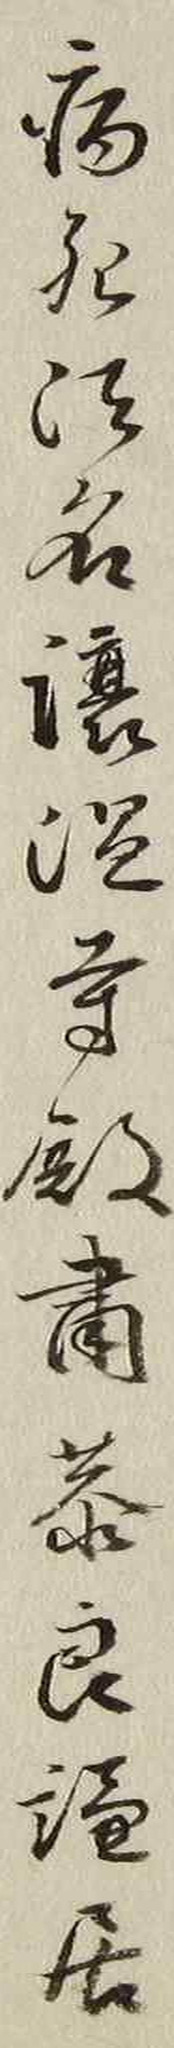病死法名譲温粛苶良譆居
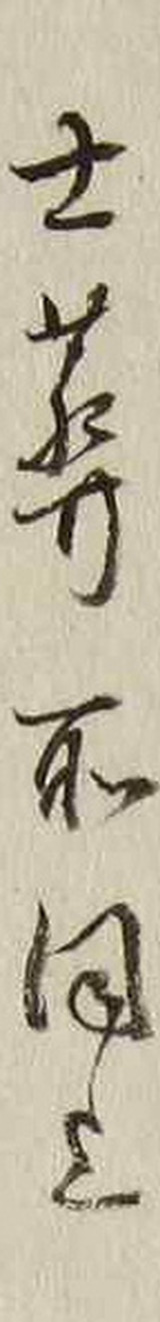士葬所同上
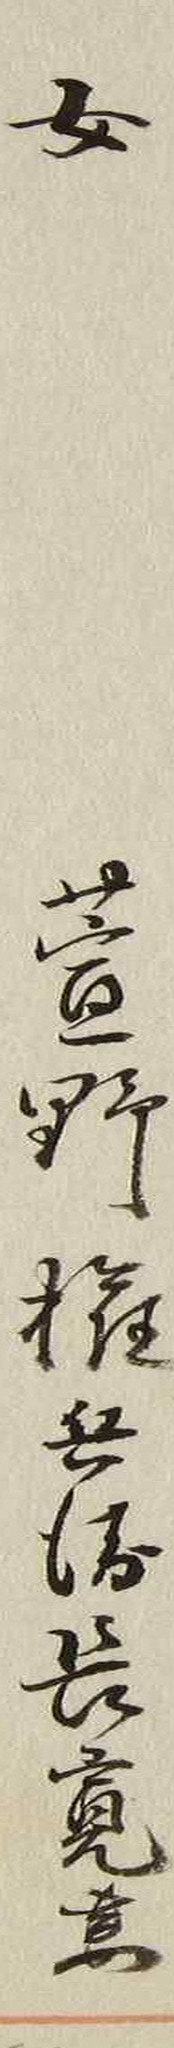女萱野権兵衛長寛妻
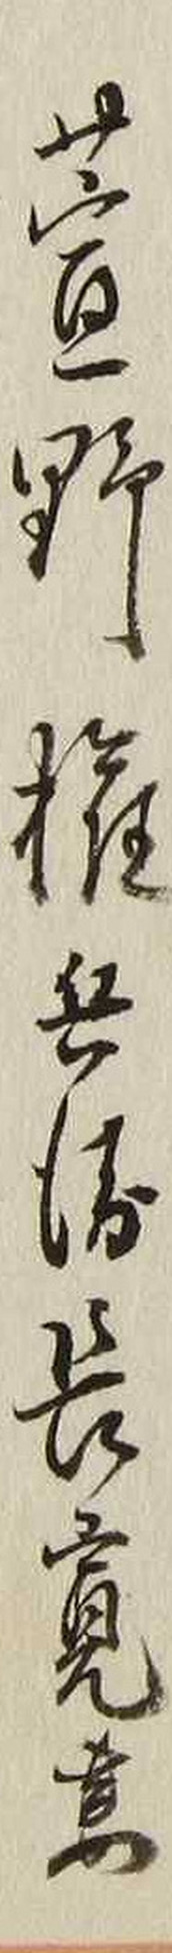女萱野権兵衛長寛妻
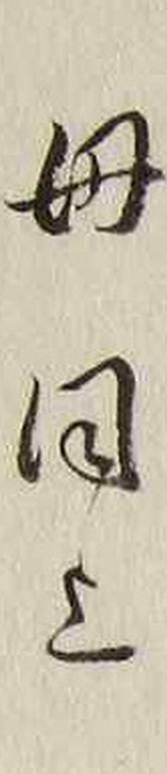母同上
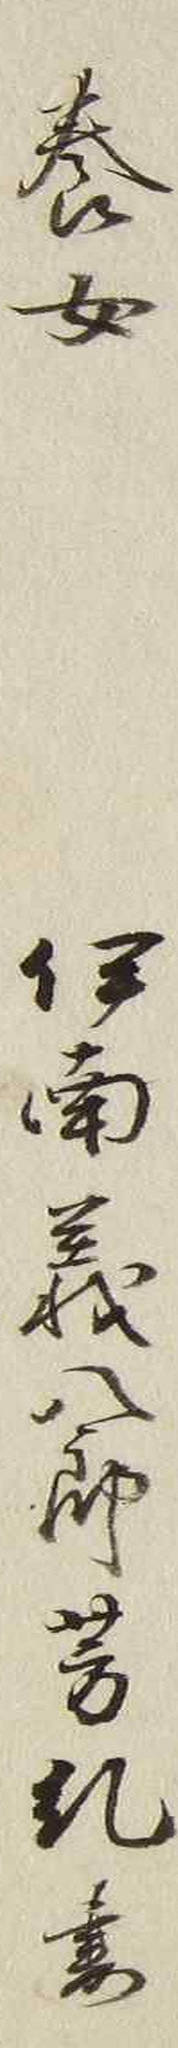養女伊南義八郎芳糺妻

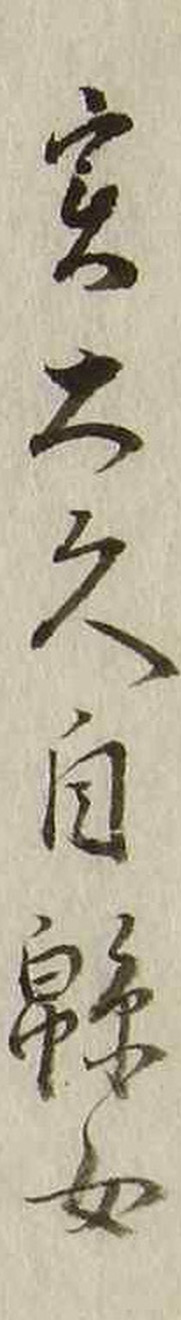実大久自緜女
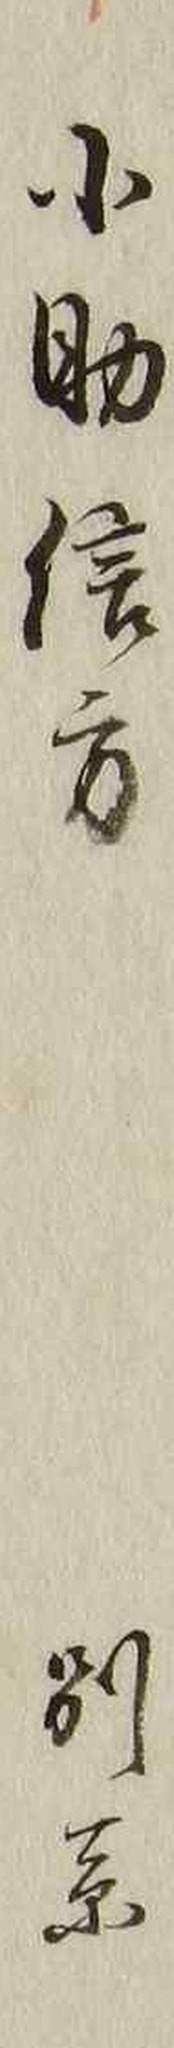小助信方別系
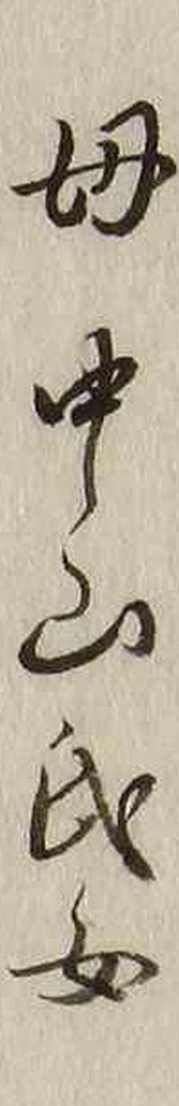母中山氏女
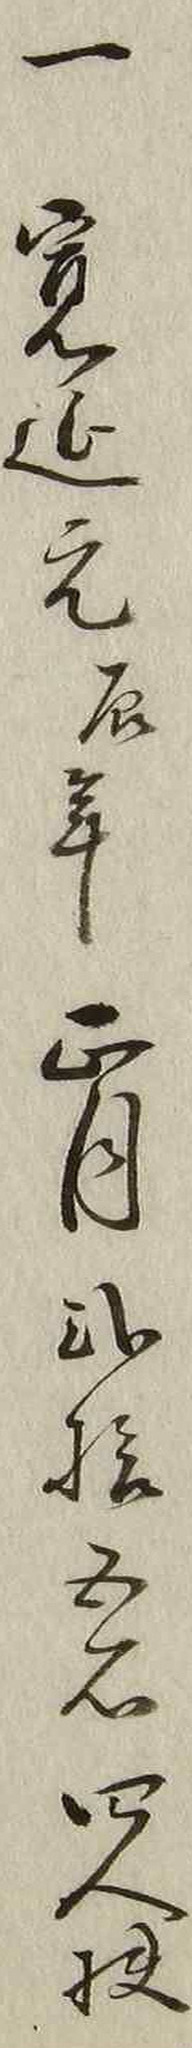一寛延元辰年正月弐拾五石四人扶
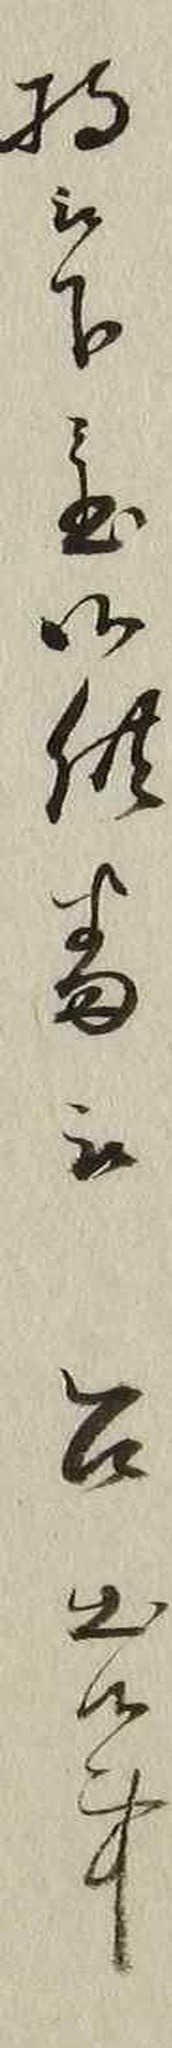知被下置御供番被召出候事
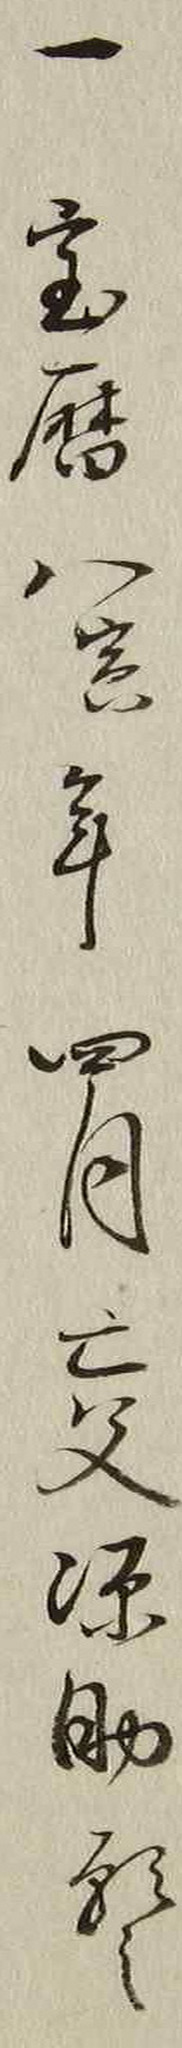一宝暦八寅年四月亡父源助願之
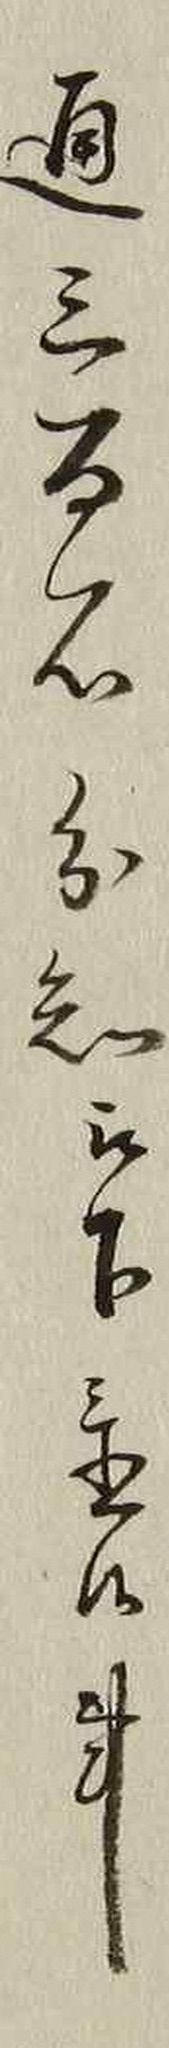通三百石分知被下置候事
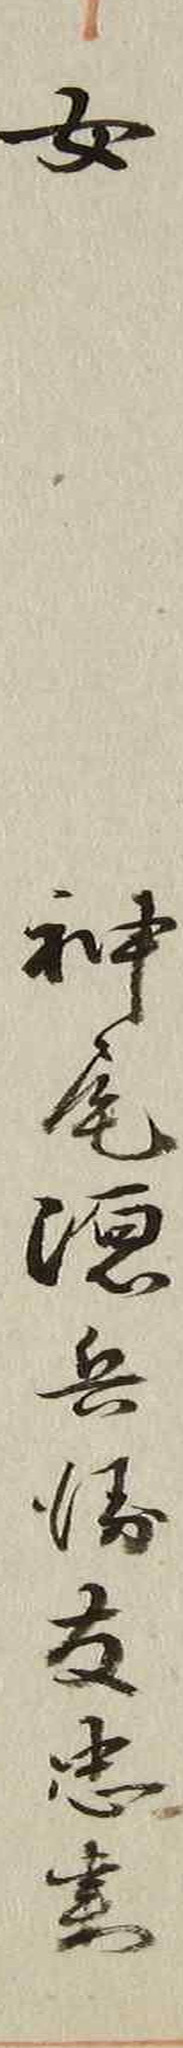女神尾源兵衛友忠妻
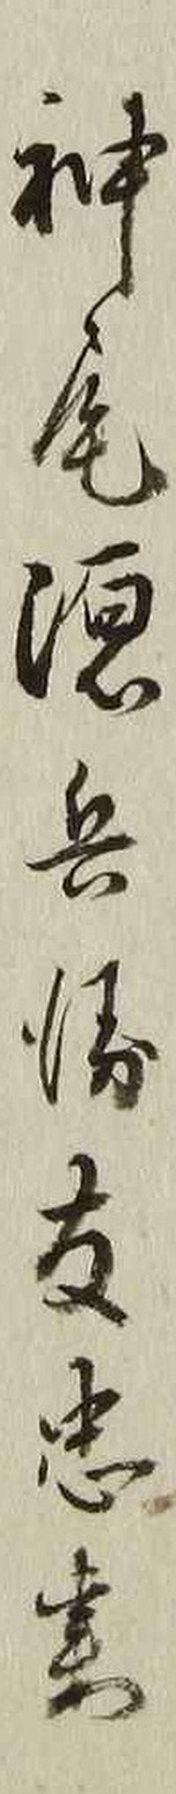女神尾源兵衛友忠妻
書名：諸士系譜　巻之159　な之部1
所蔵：会津若松市立会津図書館
